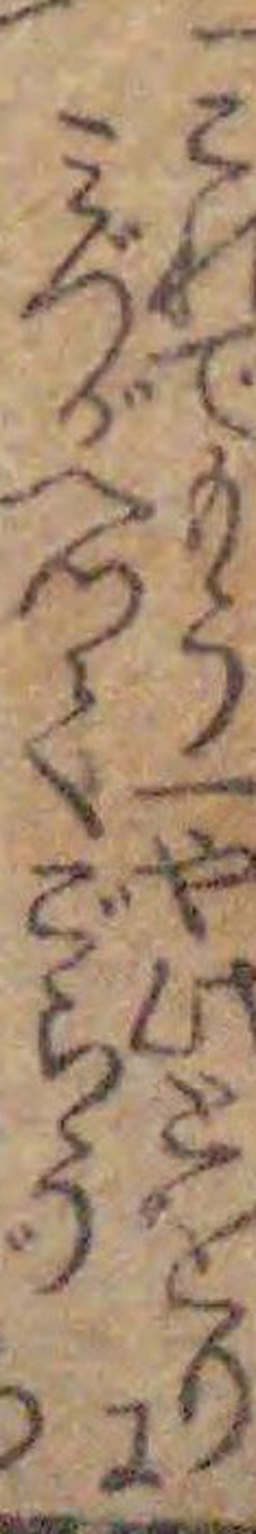みづがへつてごらう
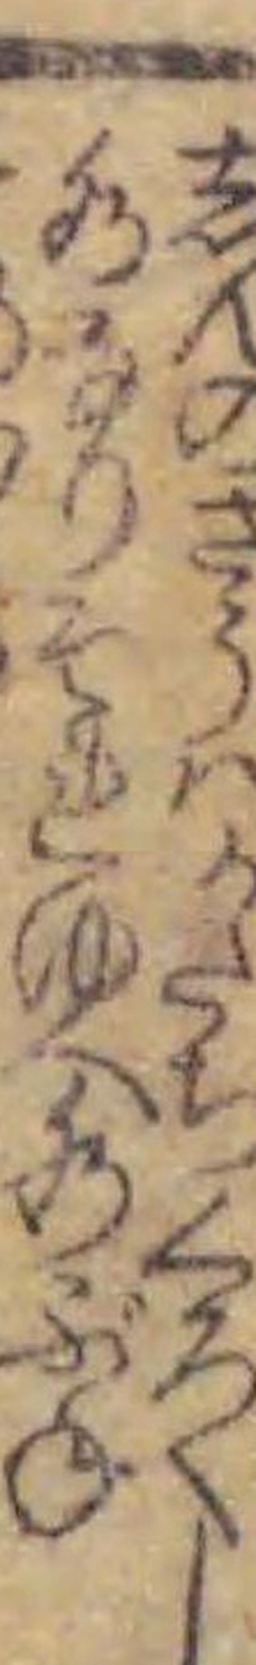水なりそれゆへ水ぶね
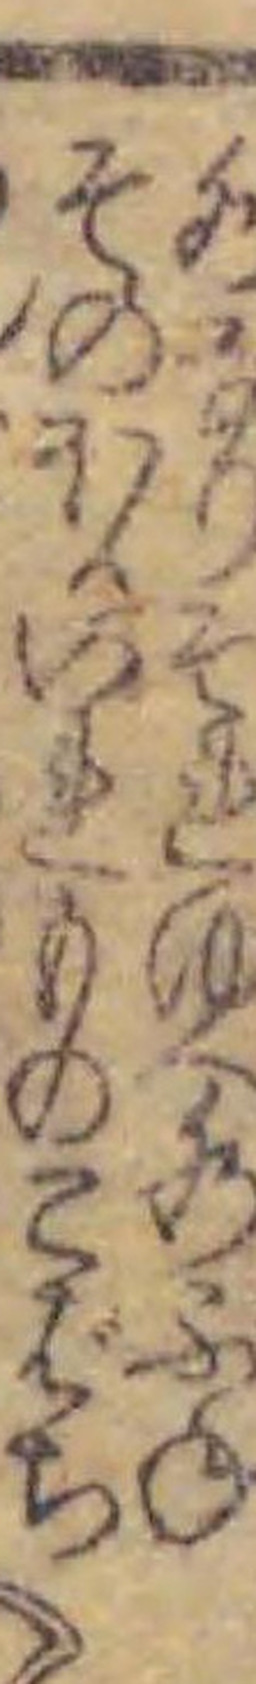そのほかいれものこばち
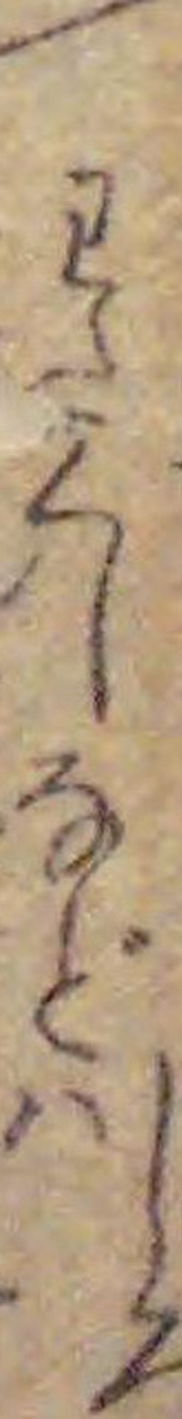わたくしなどは
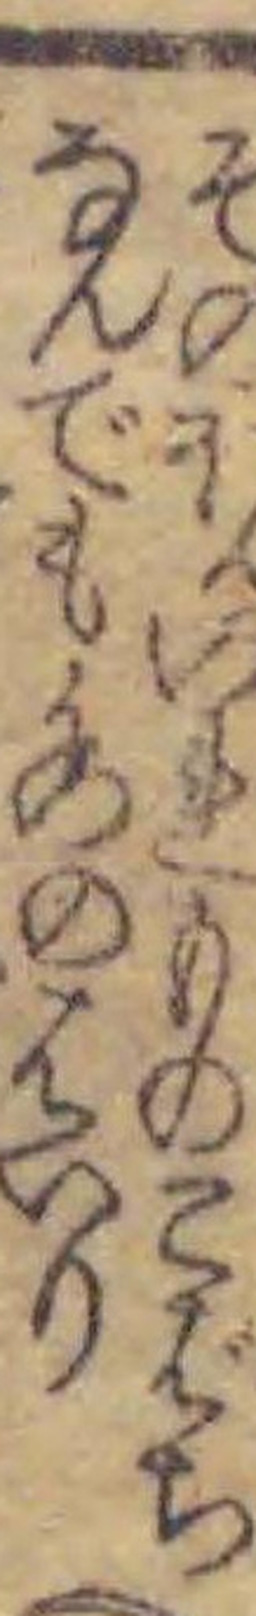なんでも水のはいり
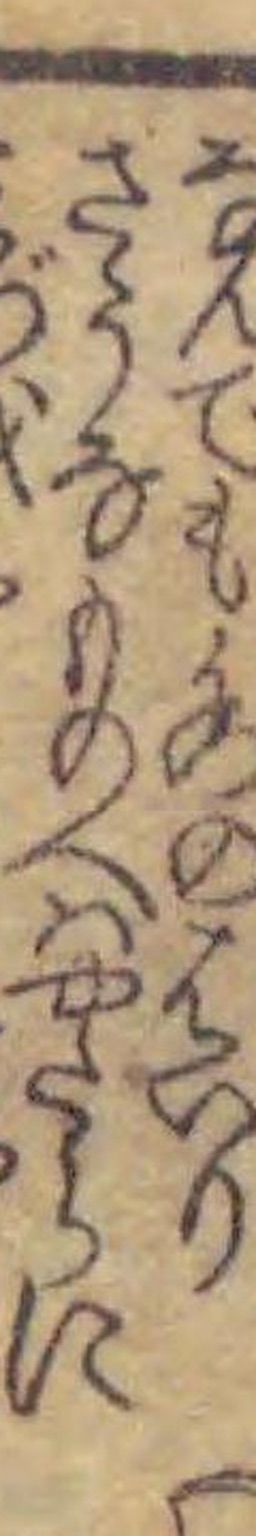さうなものへはやたらに
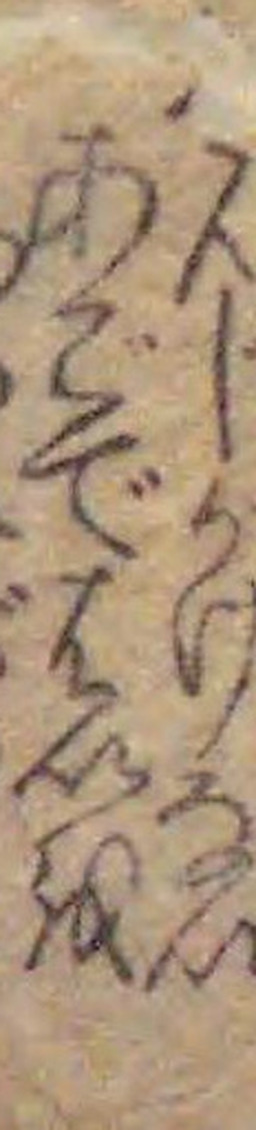あごではいを
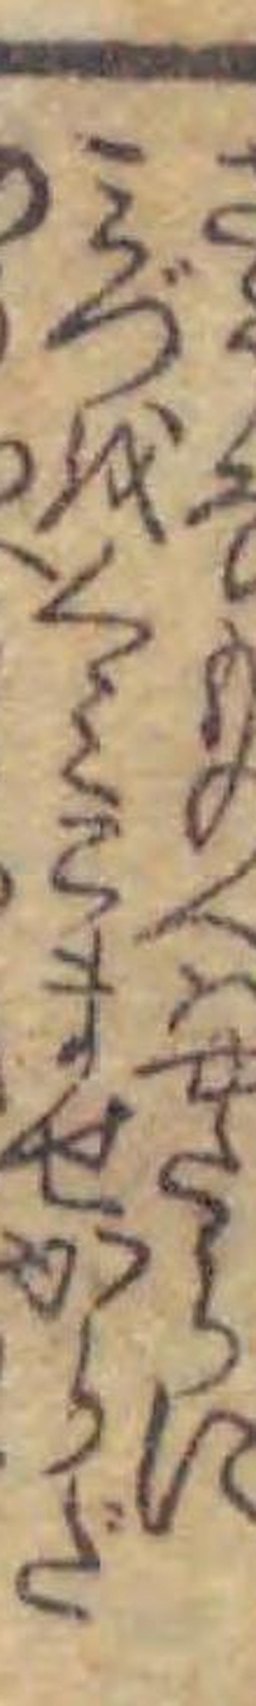みづをくみこませからだ
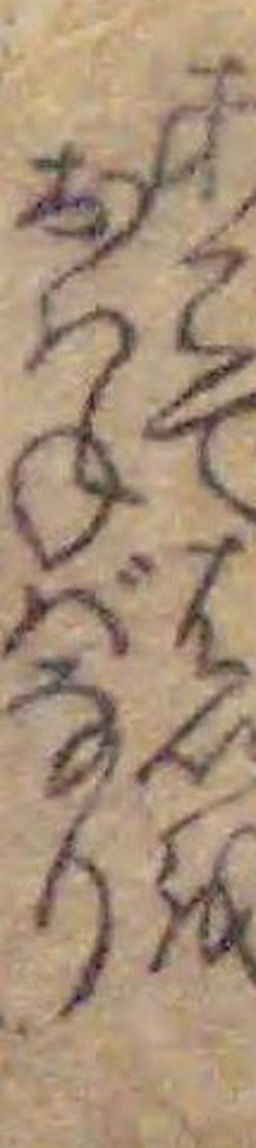おはねばなり
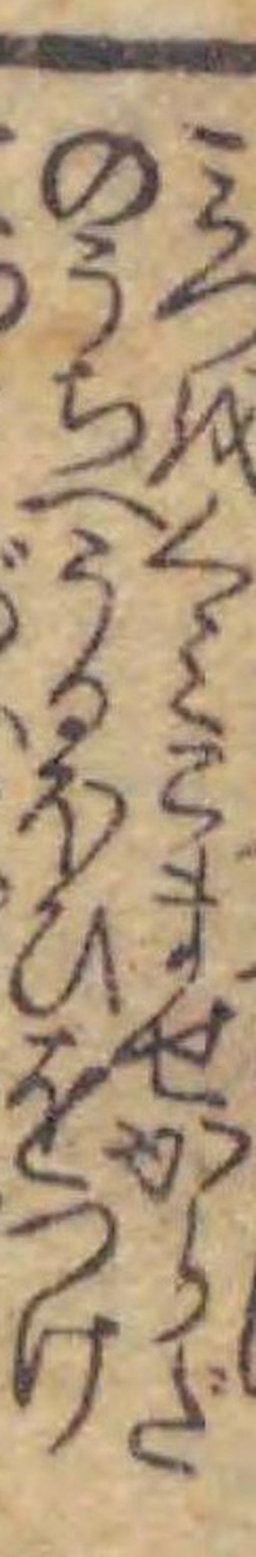のうちへうるほひをつけ
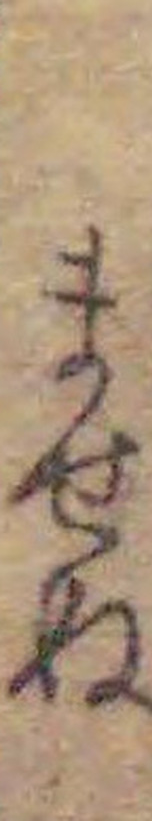ませぬ
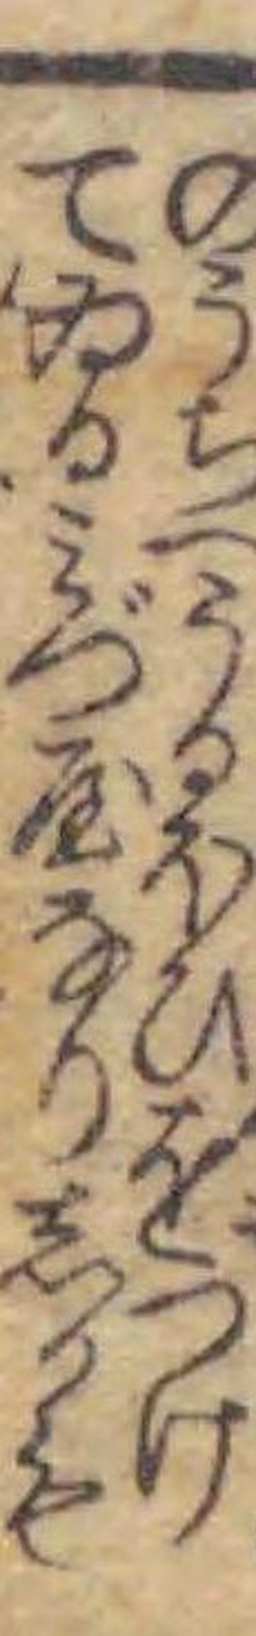てゐるみづ屋なりしかも
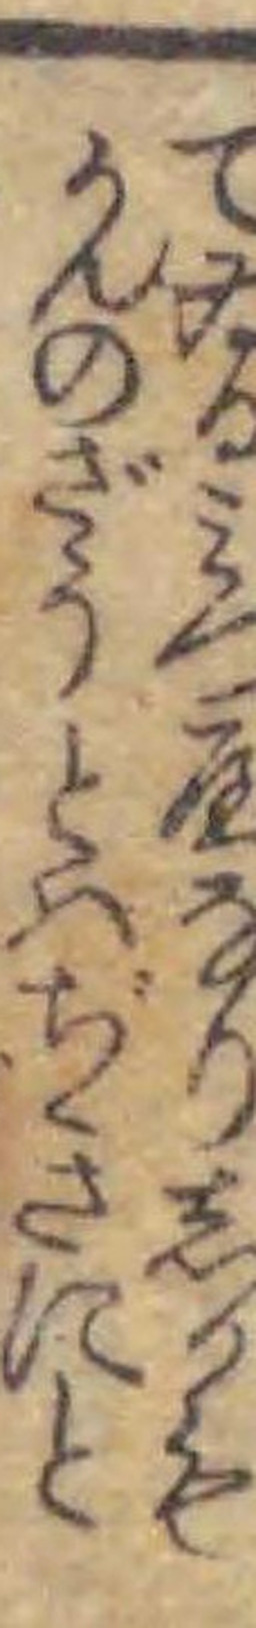かんのざうとはぢきにと
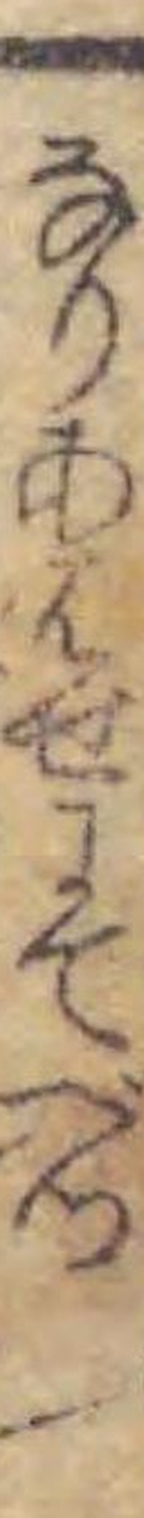なりあはせにてべつ
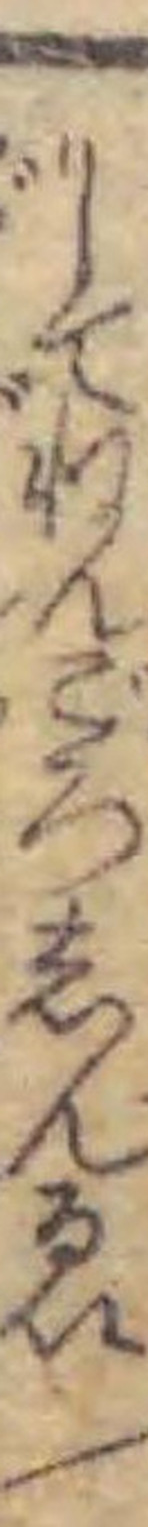してねんごろしんるい
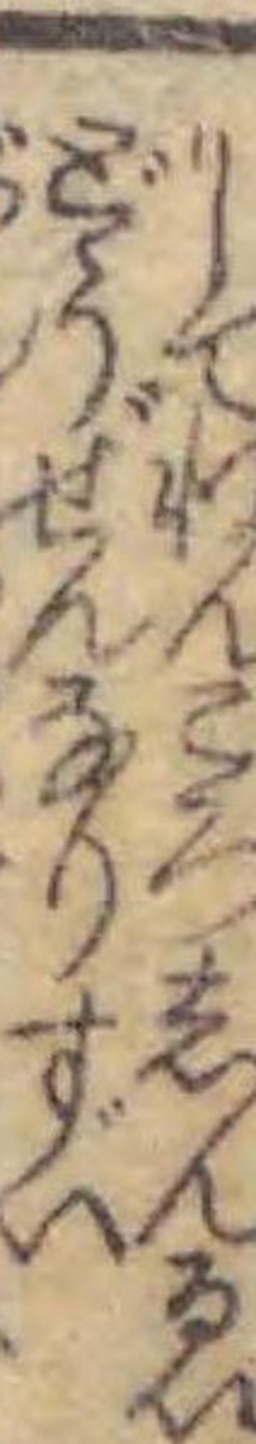どうぜんなりずい
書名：十四傾城腹之内 : 3巻
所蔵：国立国会図書館 National Diet Library, JAPAN
